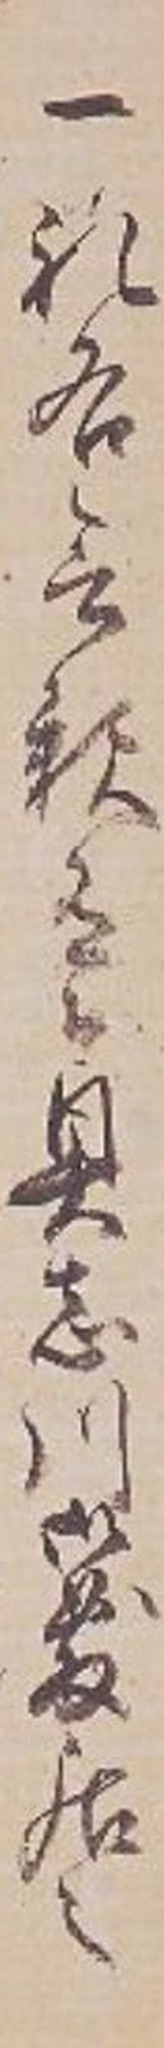一礼各会釈有而具志川御敷居之
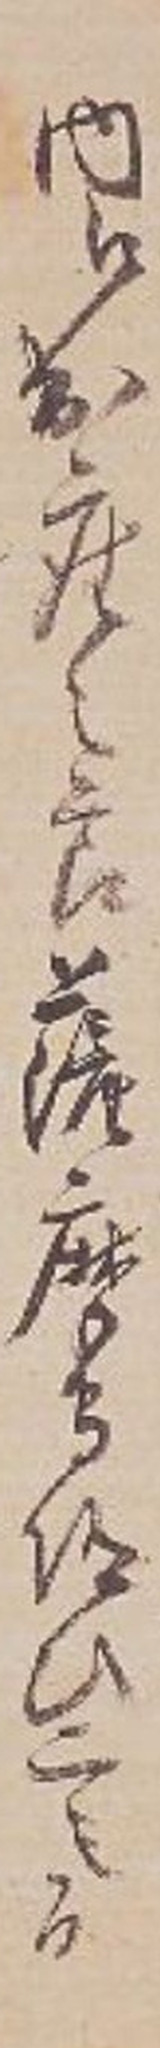内え出座之節薩摩守随ひ二之間
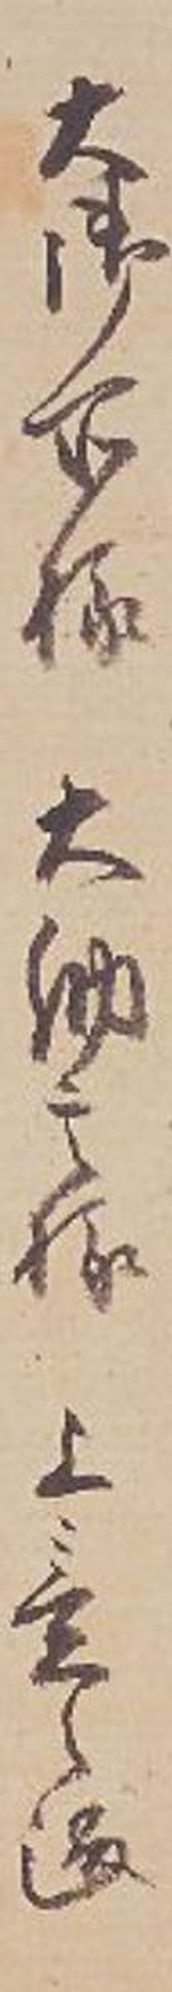大御所様大納言様上意之趣
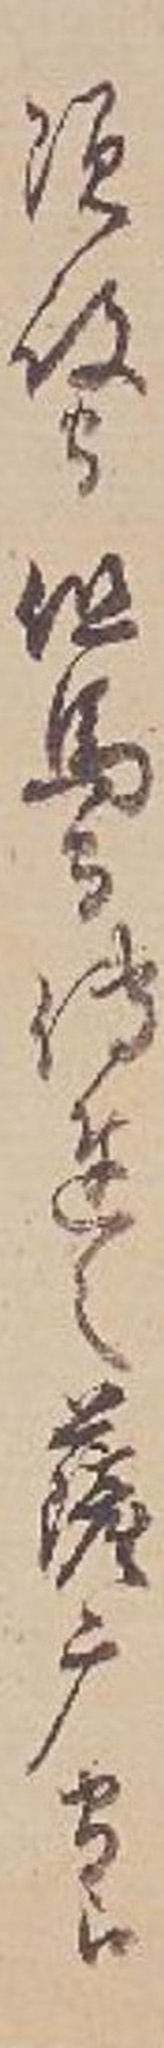隠岐守但馬守伝達之薩摩守え
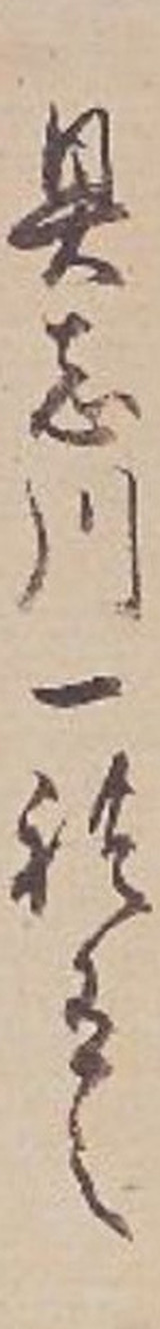具志川一礼有之
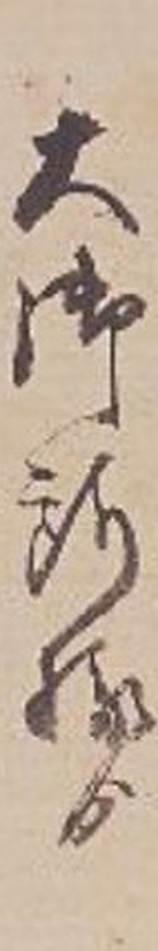大御所様ゟ
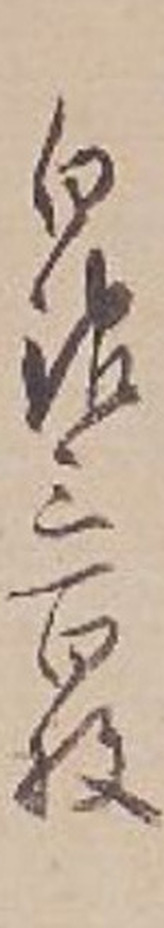白銀三百枚

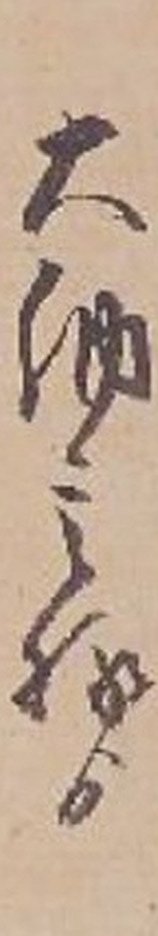大納言様ゟ
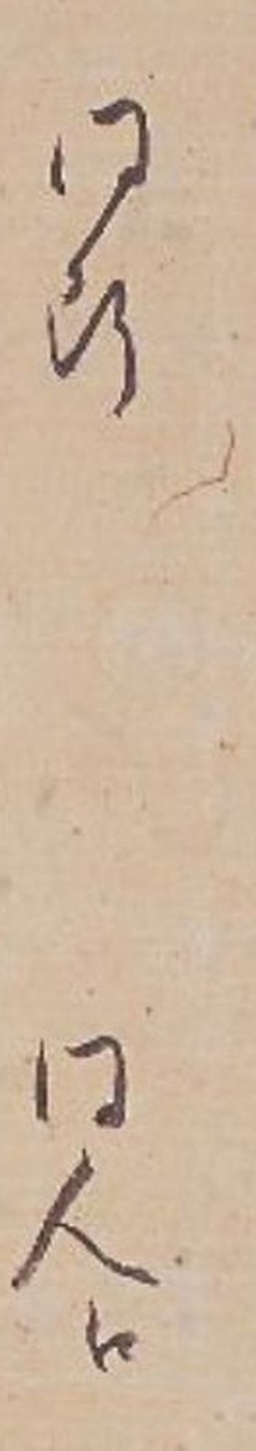同断同人え
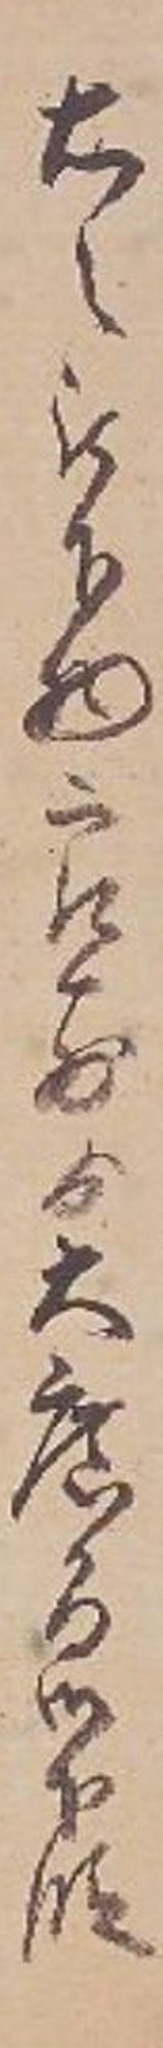右之被下物君前ゟ大広間御下段
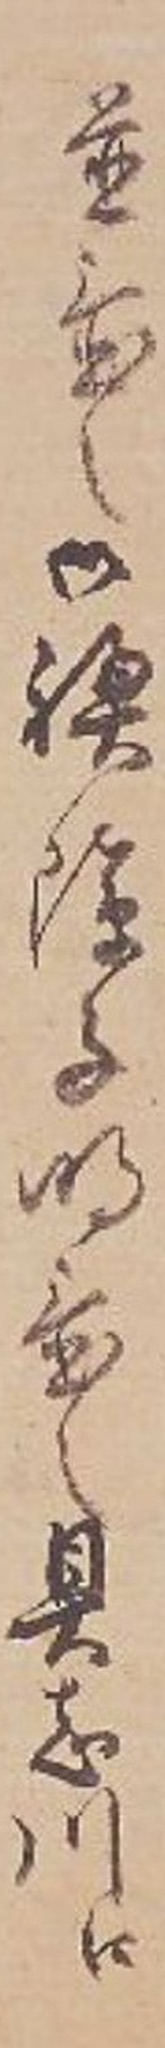並置之御襖障子明置之具志川え
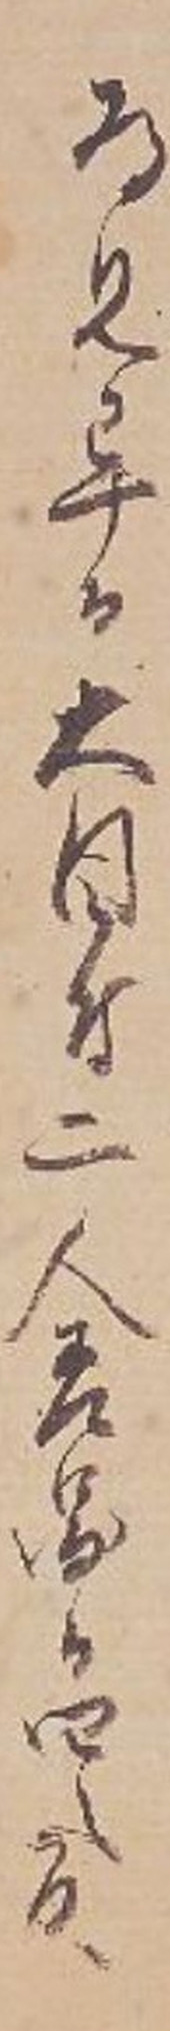為見畢而大目付二人差図而四之間へ
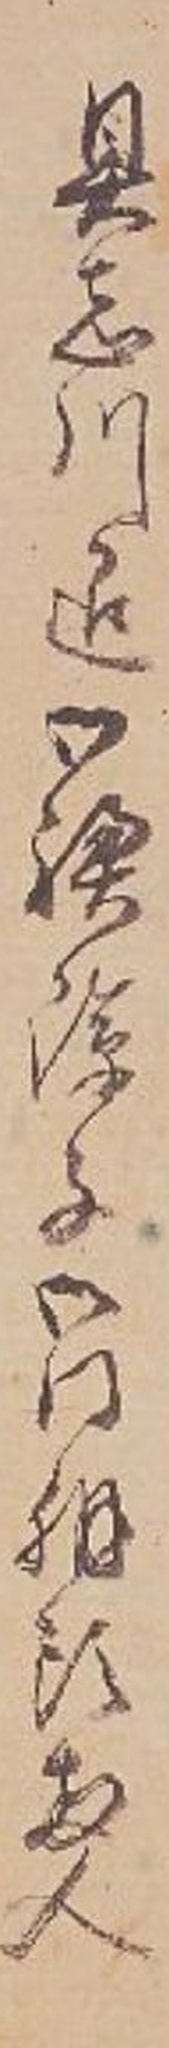具志川退御襖障子御同朋頭両人
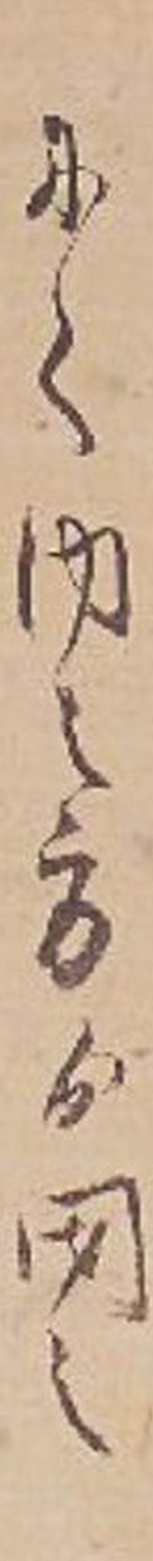にて内之方ゟ閉之
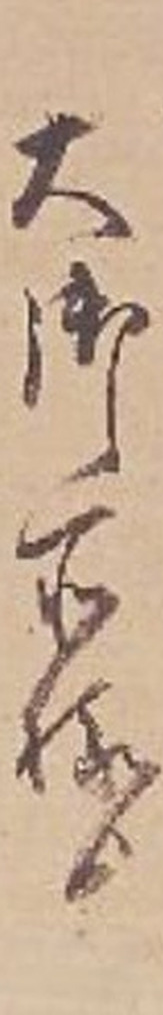大御所様ゟ
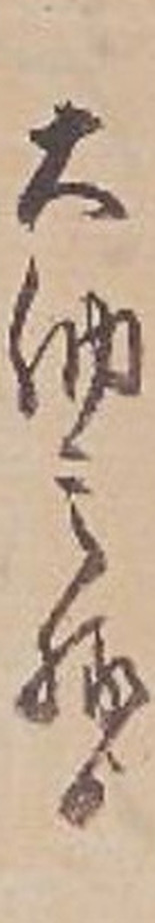大納言様ゟ
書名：琉球人来朝記 八、九
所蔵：University of the Ryukyus Library
